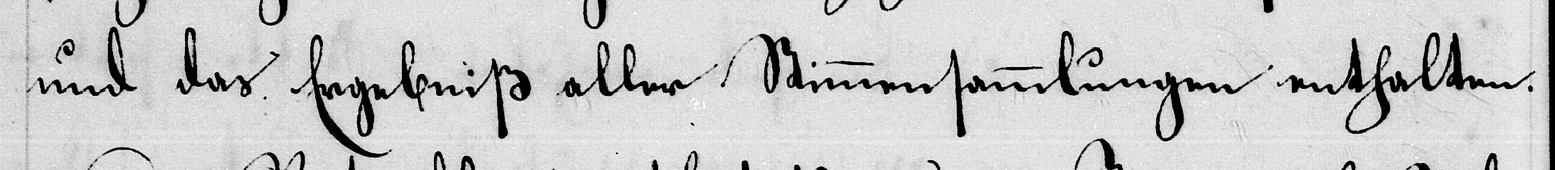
und das Ergebniβ aller Stimmensammlungen enthalten.
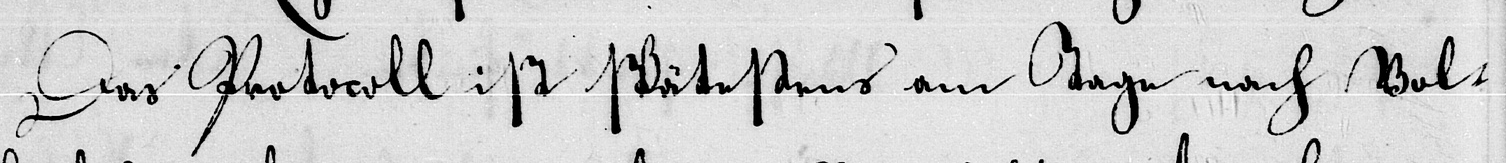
Das Protocoll ist spätestens am Tage nach Vol¬
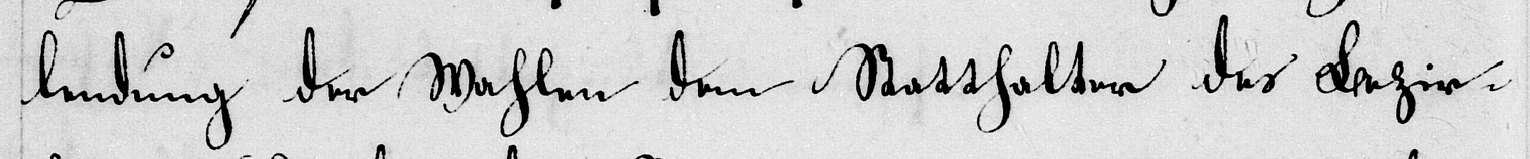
lendung der Wahlen dem Statthalter des Bezir¬
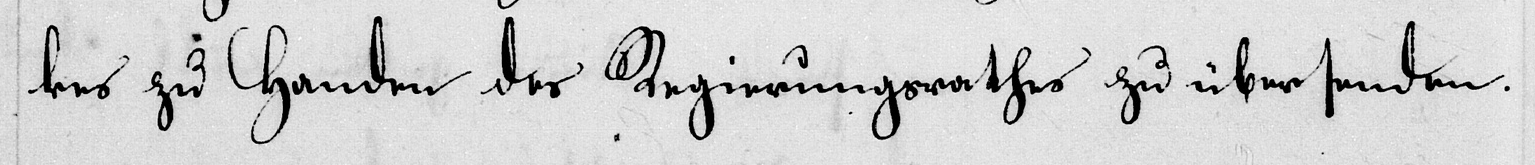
kes zu Handen des Regierungsrathes zu übersenden.
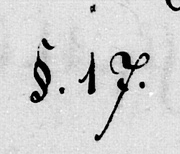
§.17.
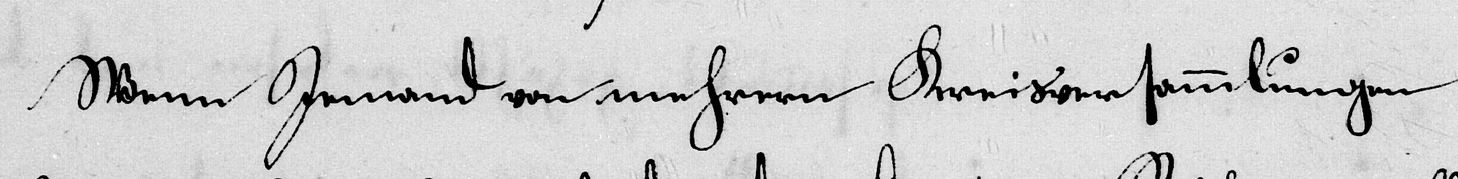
Wenn Jemand von mehreren Kreisversammlungen
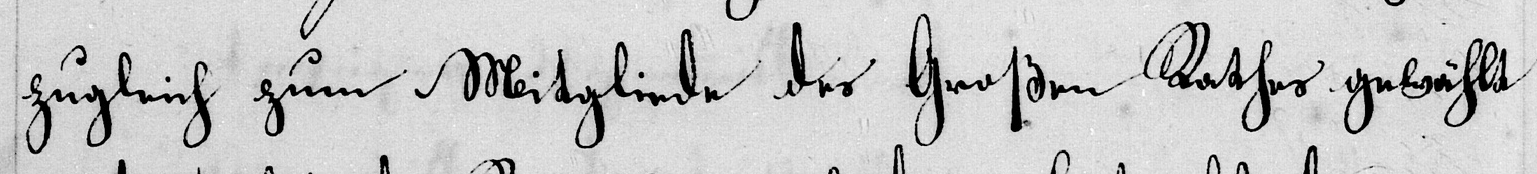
zugleich zum Mitgliede des Großen Rathes gewählt
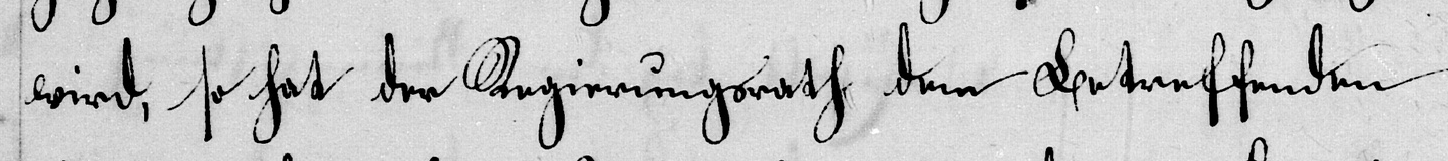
wird, so hat der Regierungsrath den Betreffenden
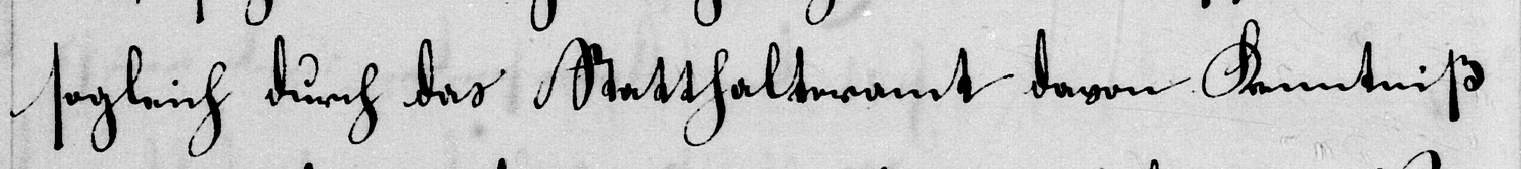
sogleich durch das Statthalteramt davon Kenntniß
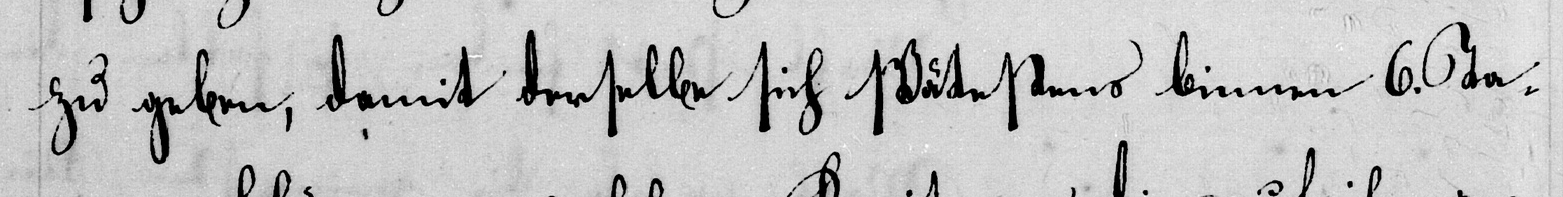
zu geben, damit derselbe sich spätestens binnen 6. Ta¬
